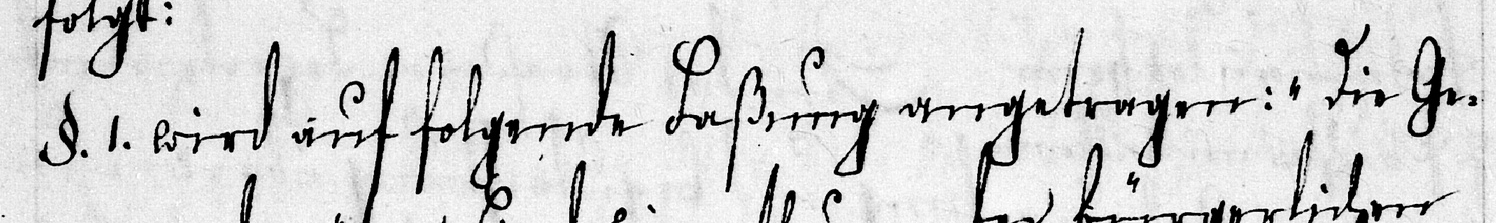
§. 1. wird auf folgende Faßung angetragen: „Die Ge¬
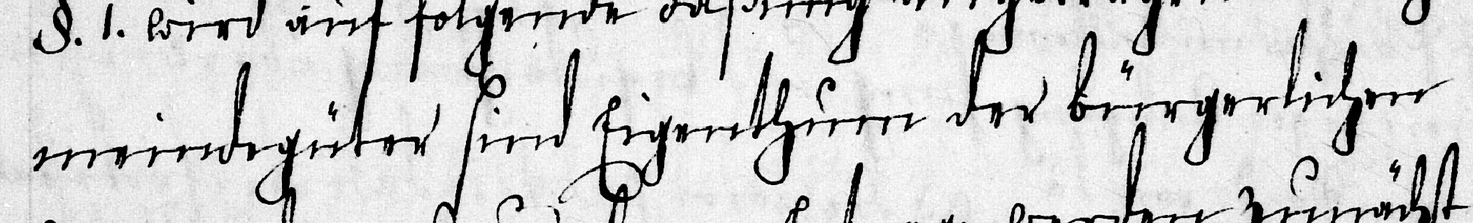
meindegüter sind Eigenthum der bürgerlichen
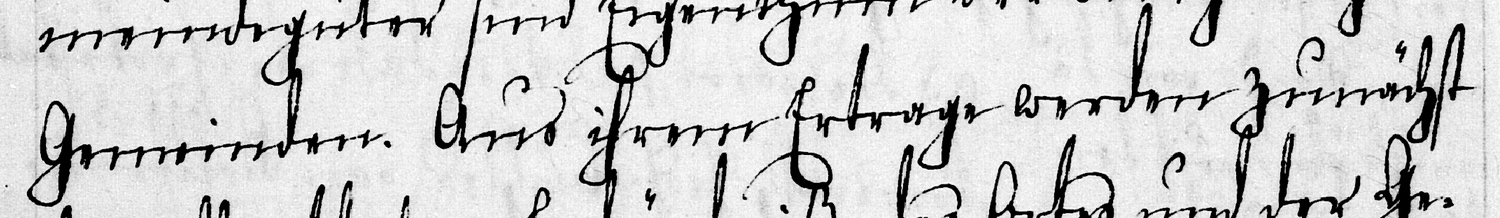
Gemeinden. Aus ihrem Ertrage werden zunächst
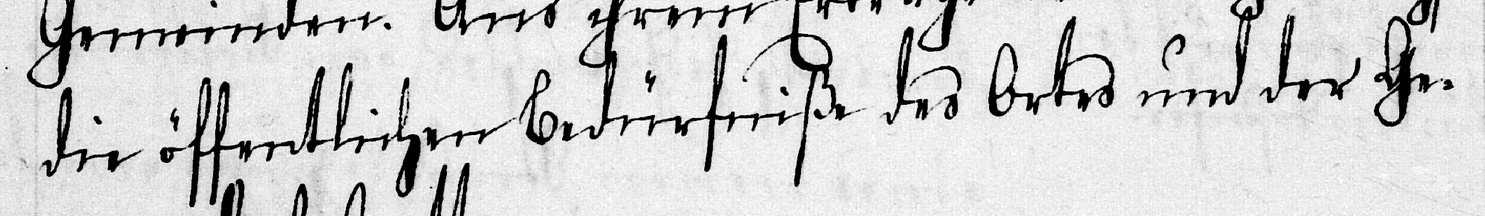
die öffentlichen Bedürfniße des Ortes und der Ge¬
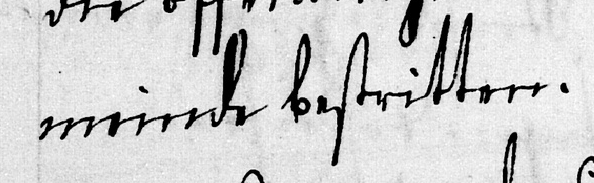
meinde bestritten.
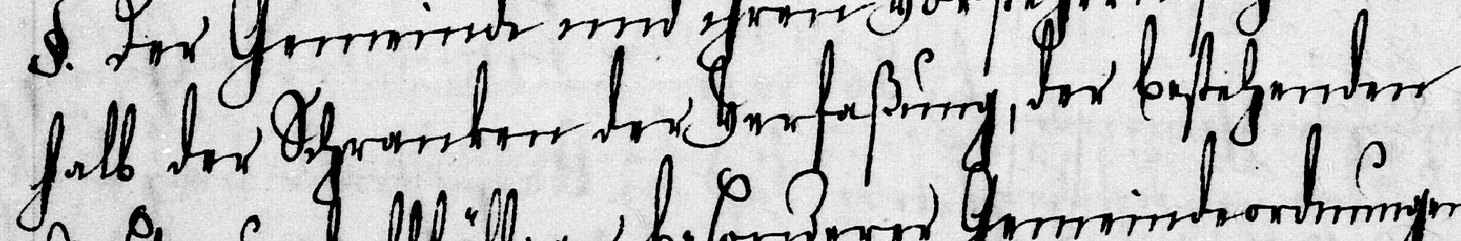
halb der Schranken der Verfaßung, der bestehenden
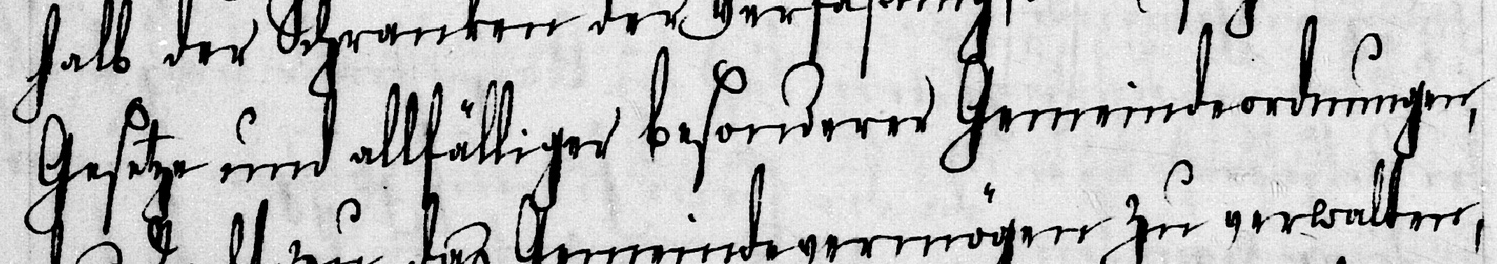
Gesetze und allfälliger besonderer Gemeindeordnungen,
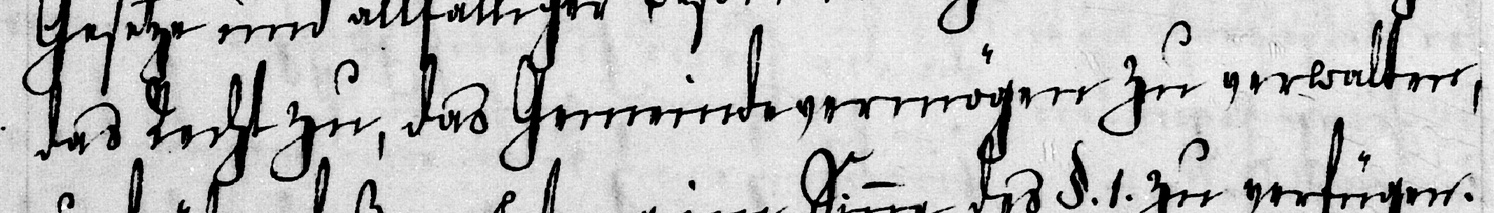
das Recht zu, das Gemeindevermögen zu verwalten,
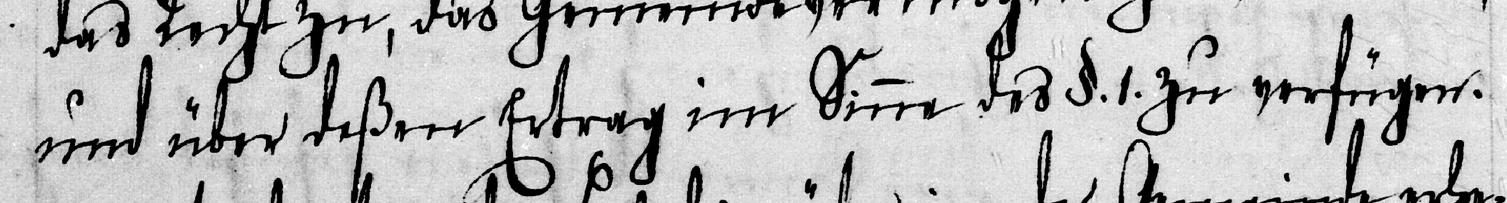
und über deßen Ertrag im Sinne des §. 1. zu verfügen.
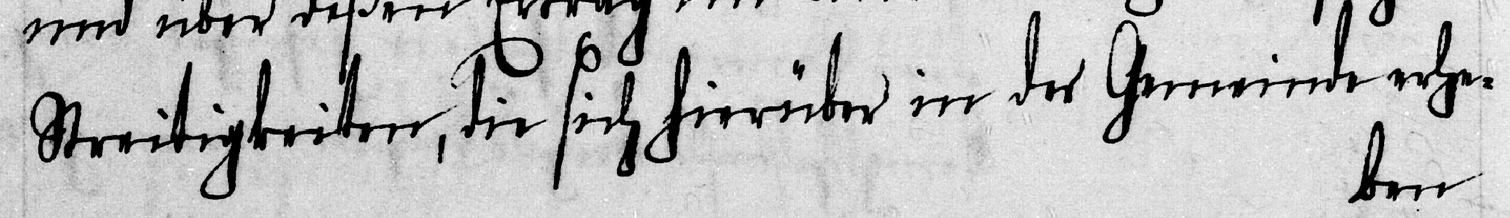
Streitigkeiten, die sich hierüber in der Gemeinde erhe-
